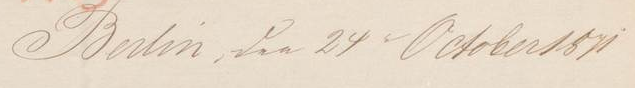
Berlin, den 24. October 1871.
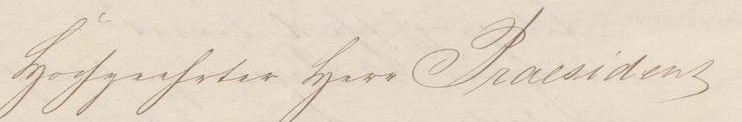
Hochgeehrter Herr Praesident
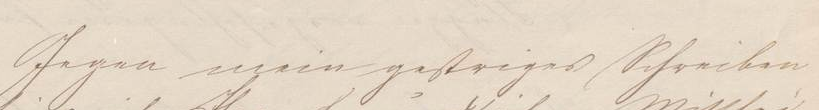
Gegen mein gestriges Schreiben
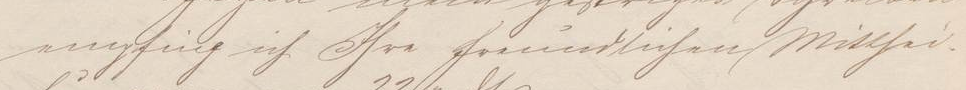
empfing ich Ihre freundlichen Mitthei-
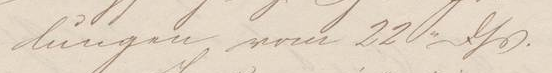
lungen vom 22 Dss.
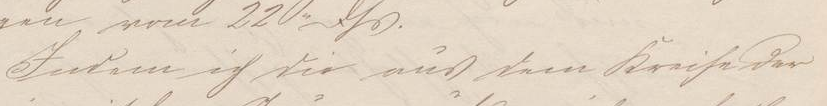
Indem ich die aus dem Kreise der
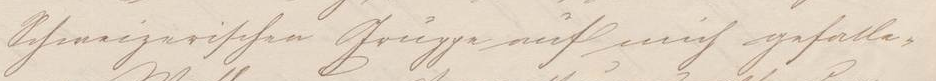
Schweizerischen Gruppe auf mich gefalle-
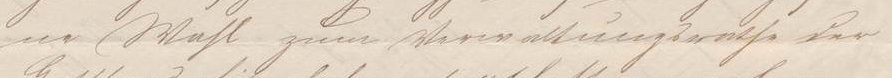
ne Wahl zum Verwaltungsrathe der
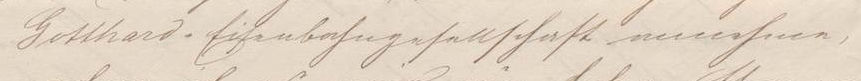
Gotthard-Eisenbahngesellschaft annehme,
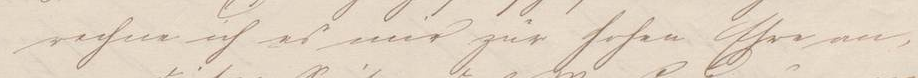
rechne ich es mir zur hohen Ehre an,
